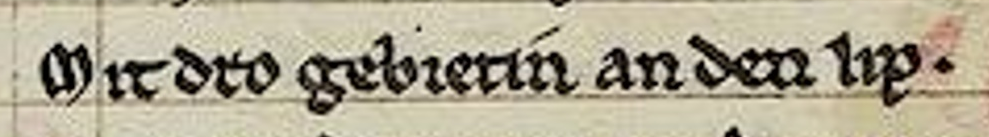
Mit dro gebietin an den lip.
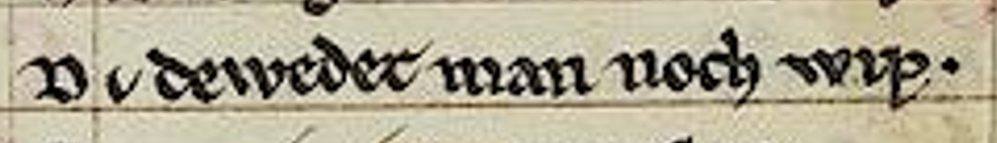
D(az) deweder man noch wip.
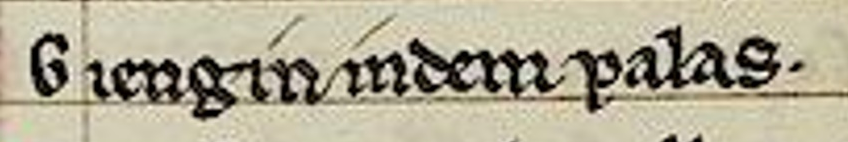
Giengin indem palas.
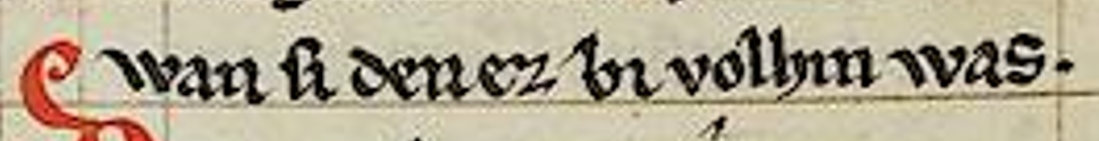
Wan ſi den ez bi volhin was.
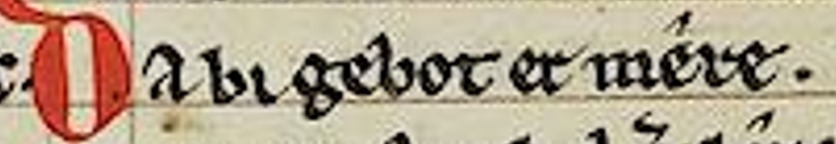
*Da bi gebot er mere.
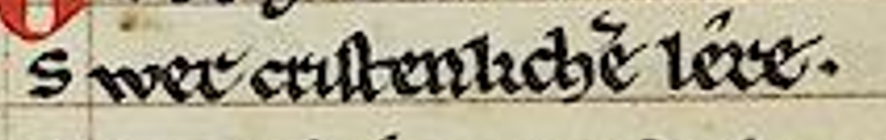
Swer criſtenliche(er) lere.
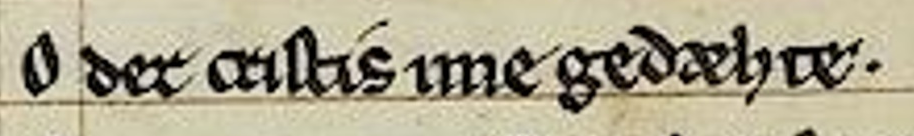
Oder criſtis ime ged[ae]hte.
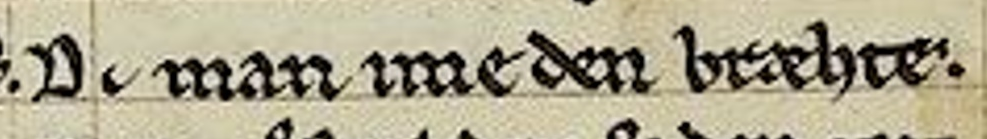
D(az) man ime den br[ae]hte.
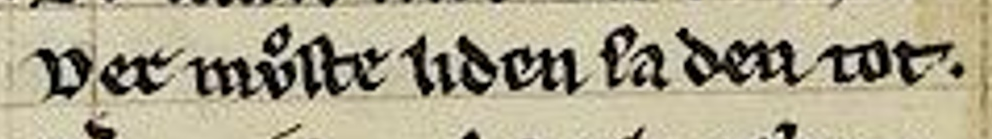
Der mv°oſte liden ſa den tot.
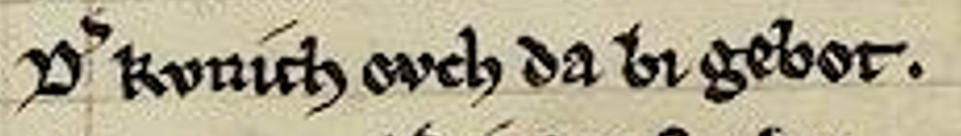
D(er) kvnich ovch da bi gebot.
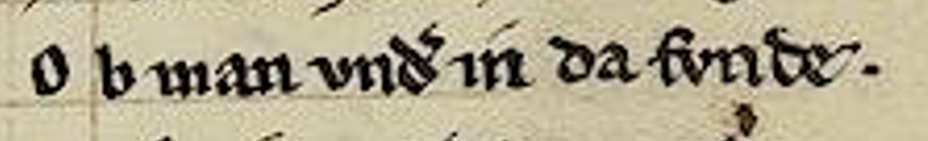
Ob man und(er) in da fvnde.
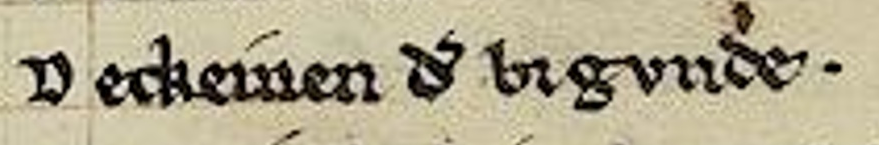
Deckeinen d(er) bigvnde.
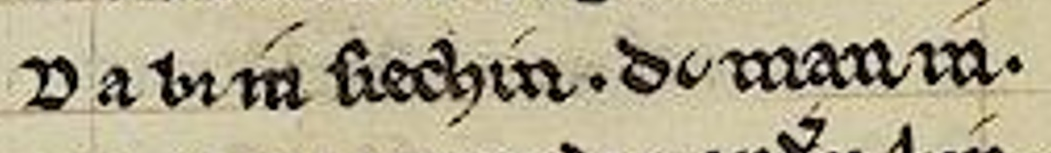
Da bi in ſiechin. d(az) man in.
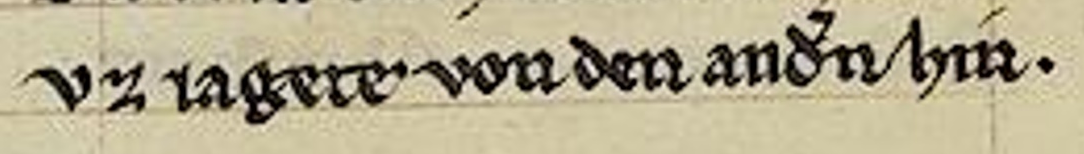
Vz iagete von den and(er)n hin.
